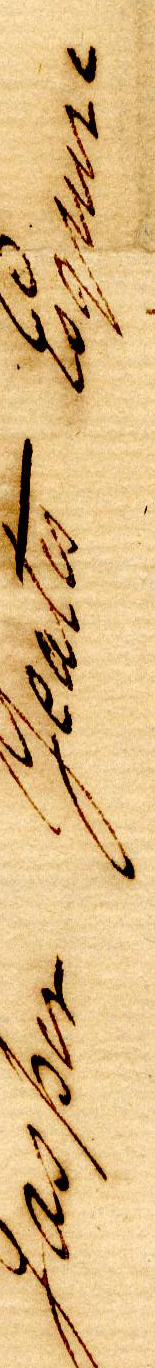Jasper Yeates Esquire
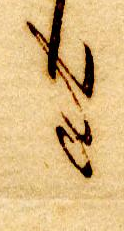at
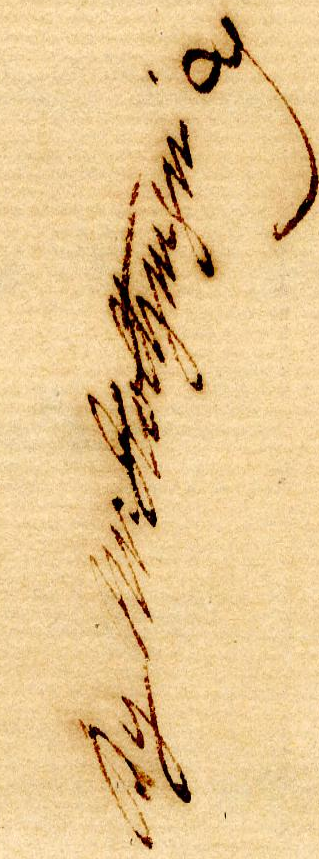by M^r Holzinger
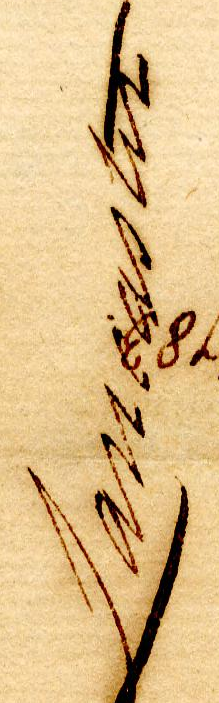Lancaster
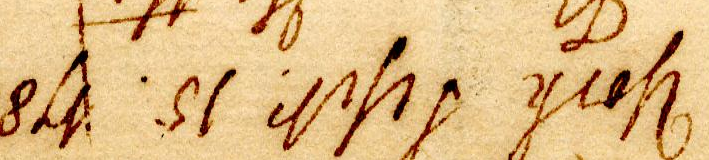York Sept^r. 15th. 1783
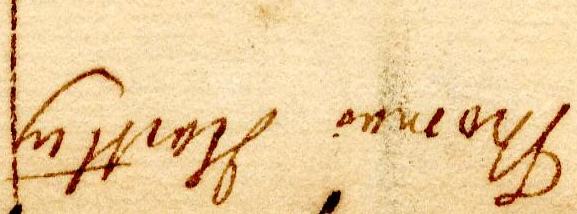Thomas Hartley
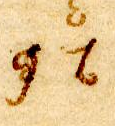2.6
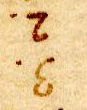3.
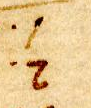2.
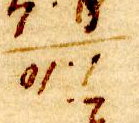1.10
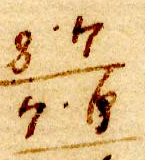9.4
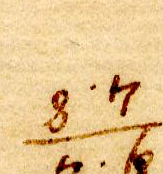4.8
